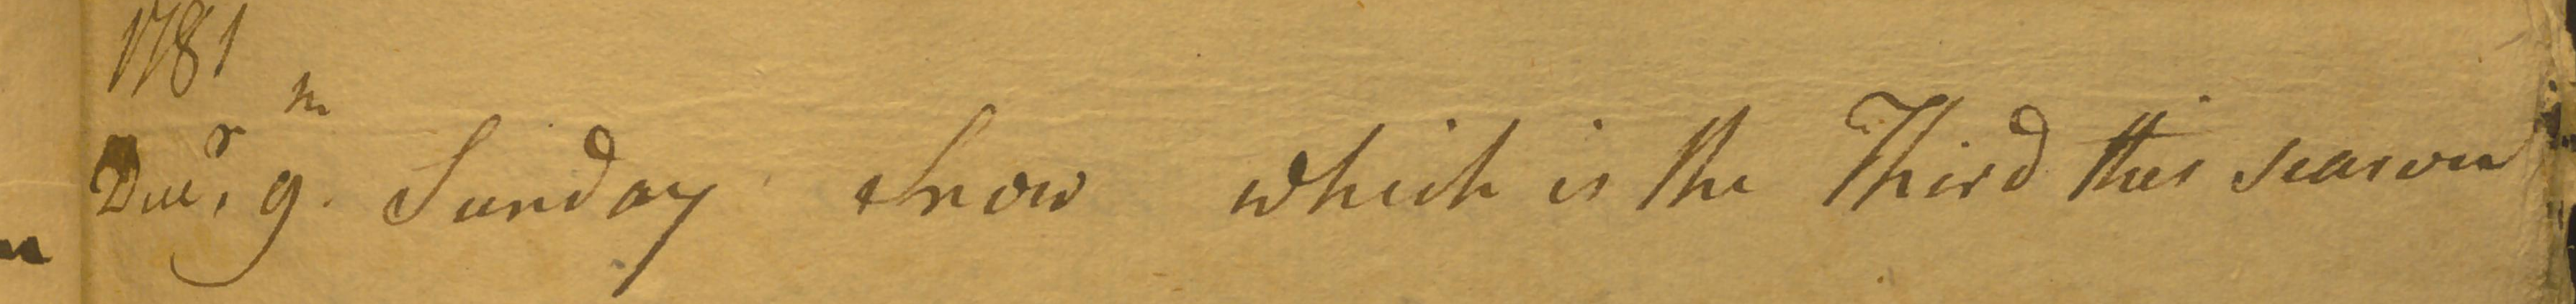Dec^r. 9^th Sunday Snow which is the Third this season
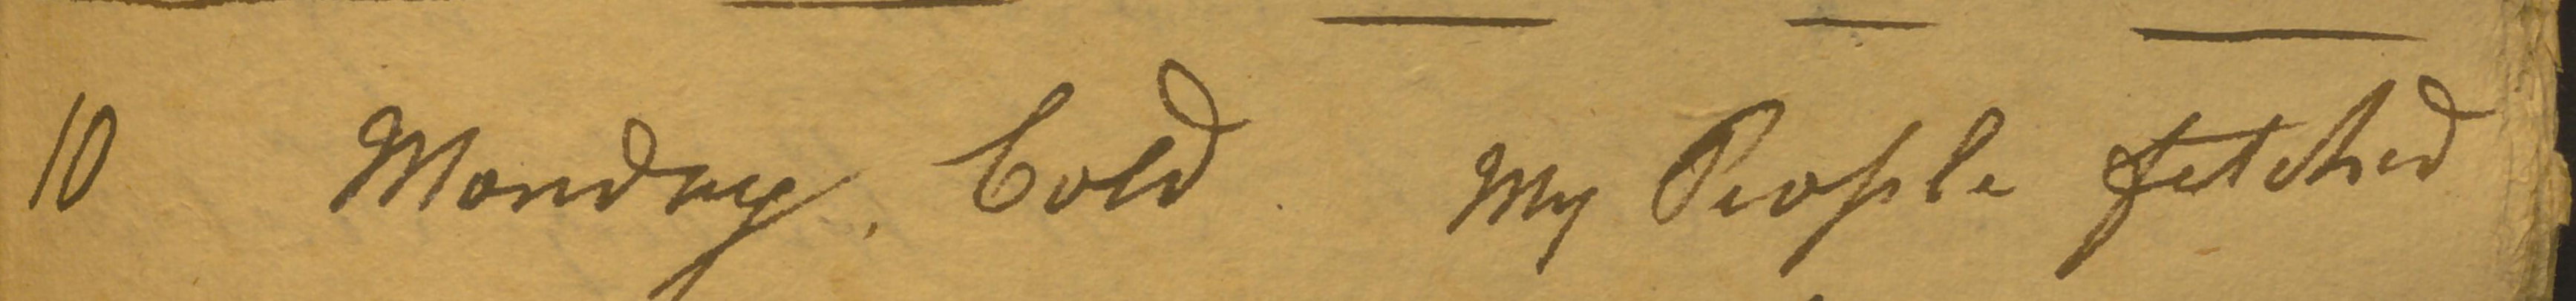10 Monday. Cold My People fetched
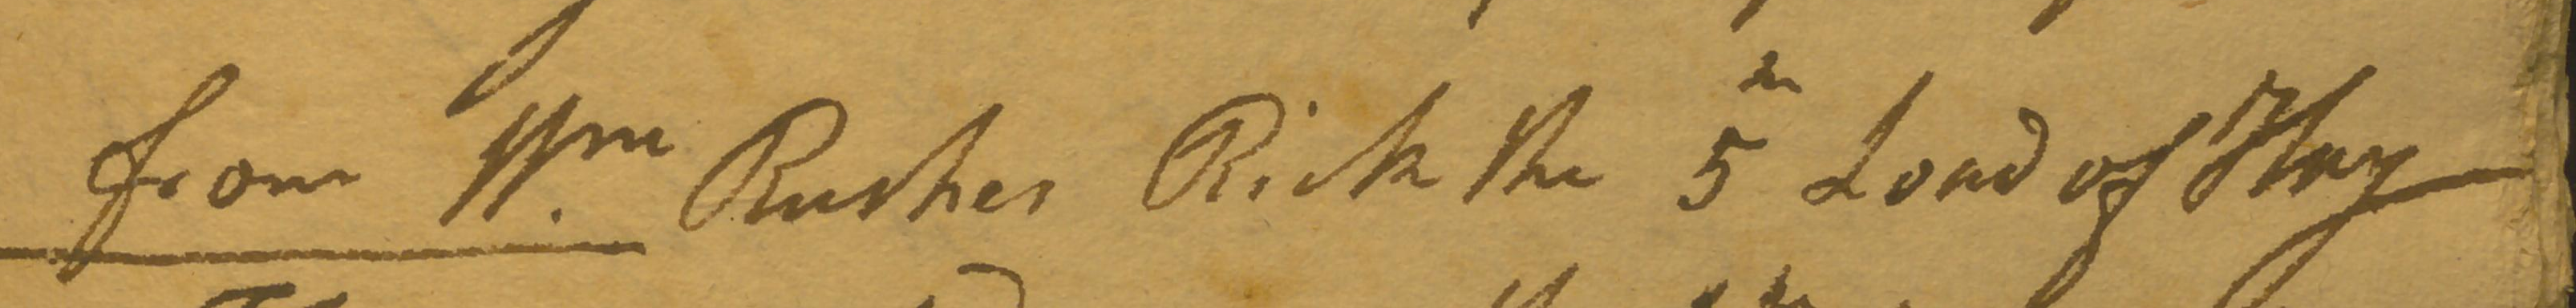from W^m. Rushes Rick the 5^h Load of Hay
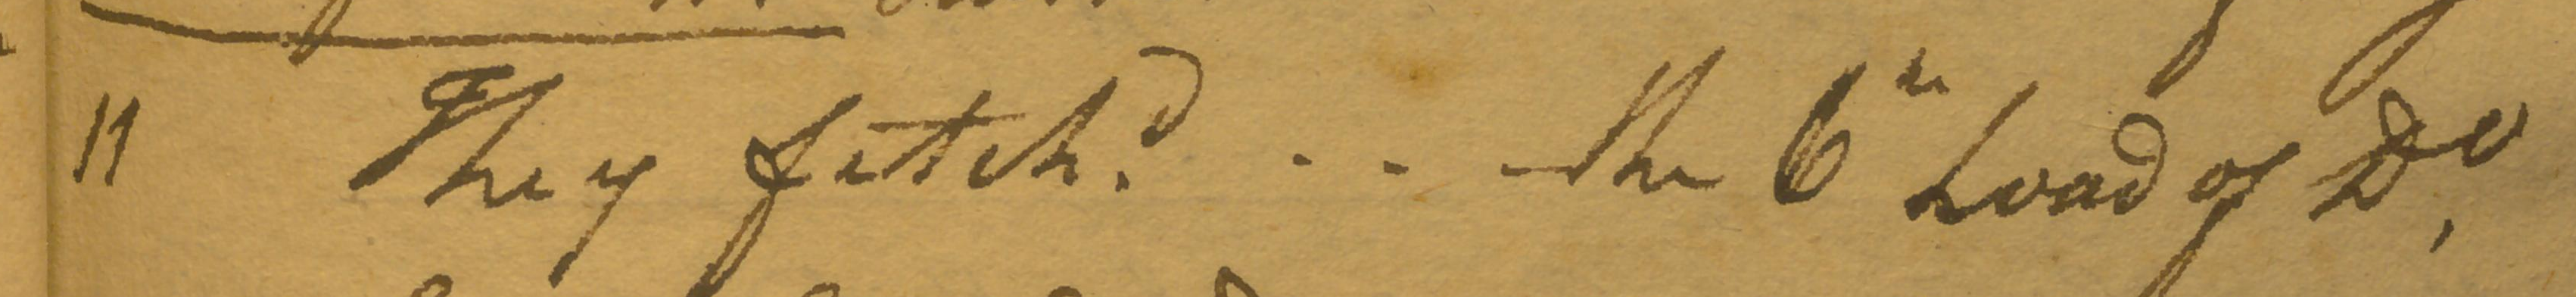11 They fetch^d. .. the 6^th Load of D^o.
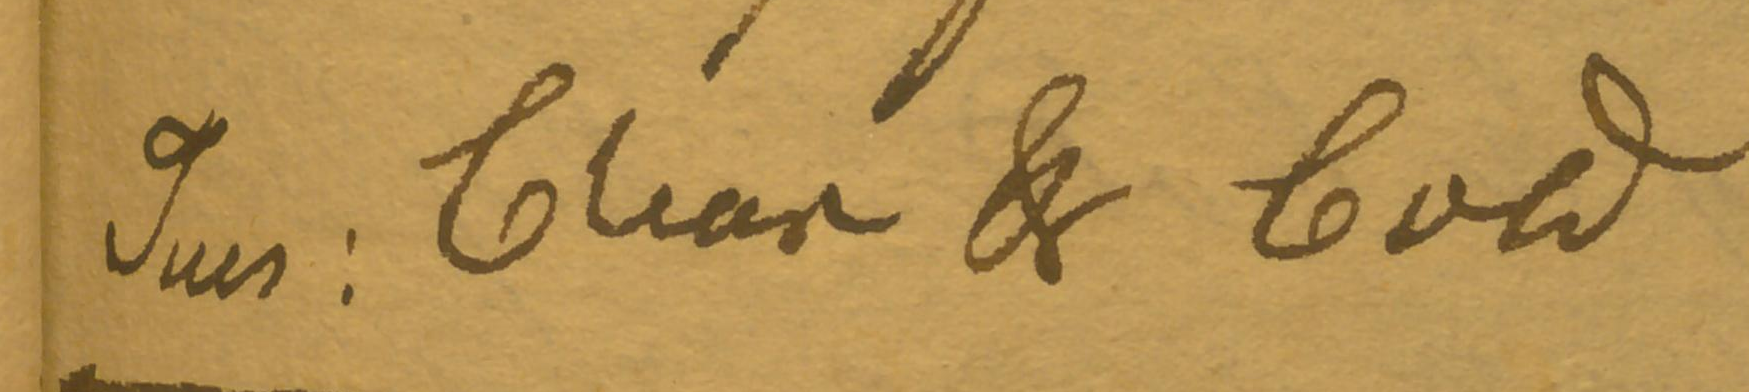Tues Clear & Cold
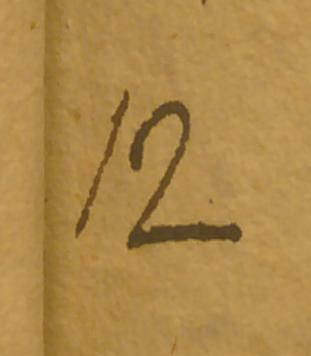12
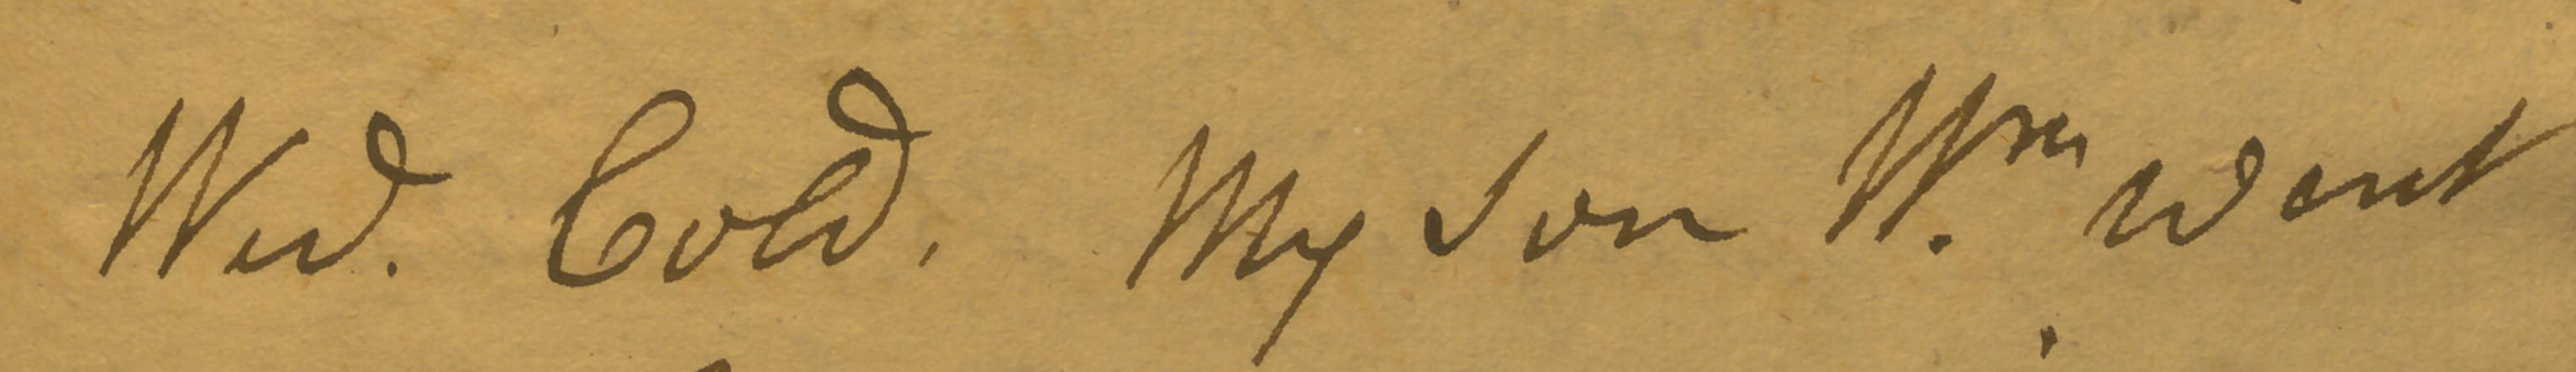Wed. Cold. My Son W^m. Went
